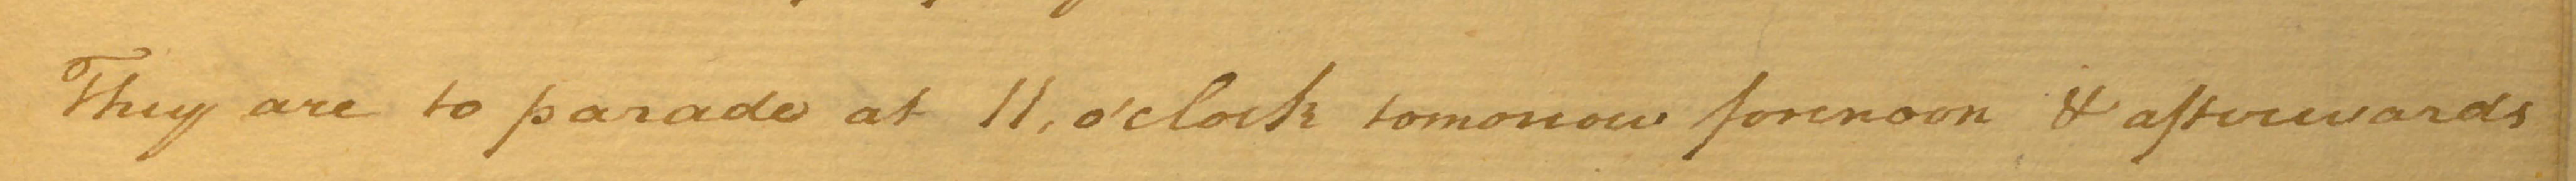They are to parade at 11, o'clock tomorrow fornoon & afterwards
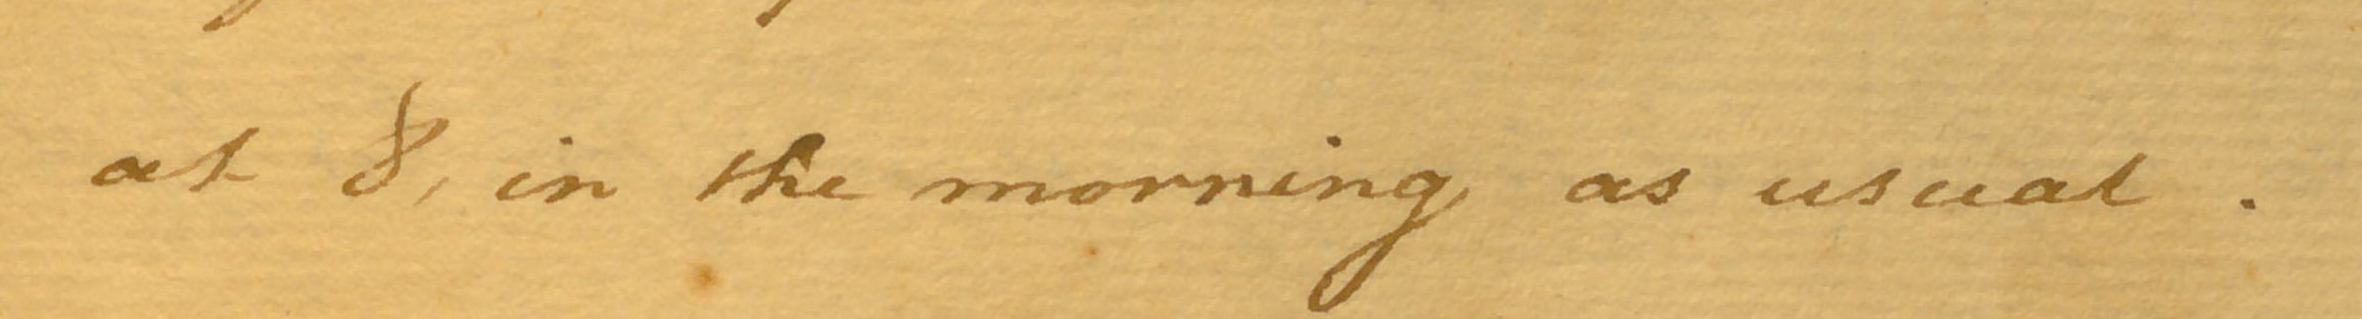at 8, in the morning as usual.
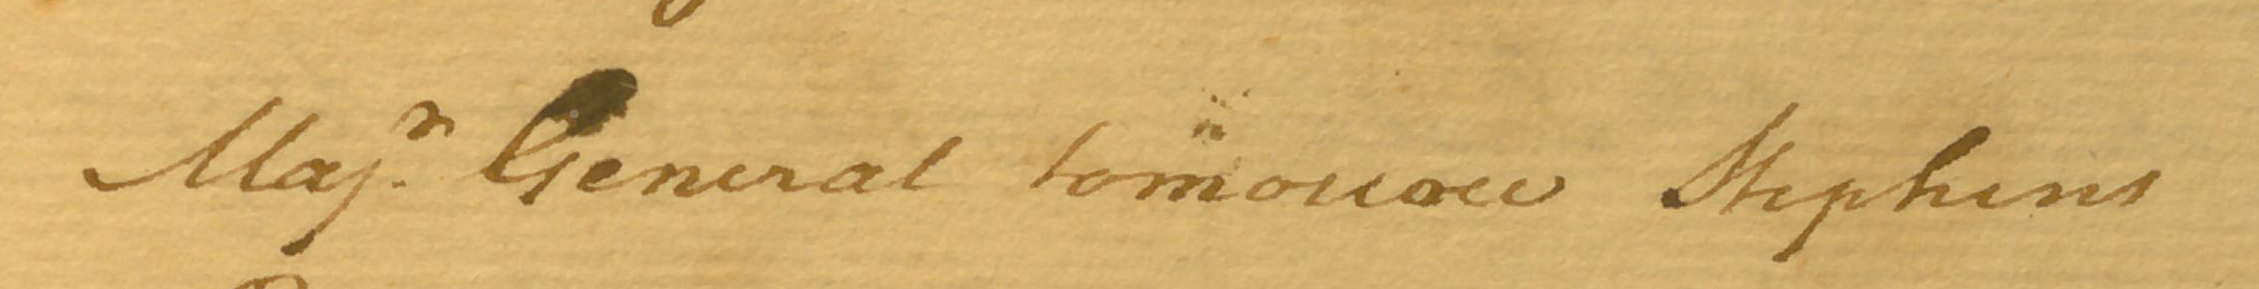Maj^r. General tomorrow Stephens
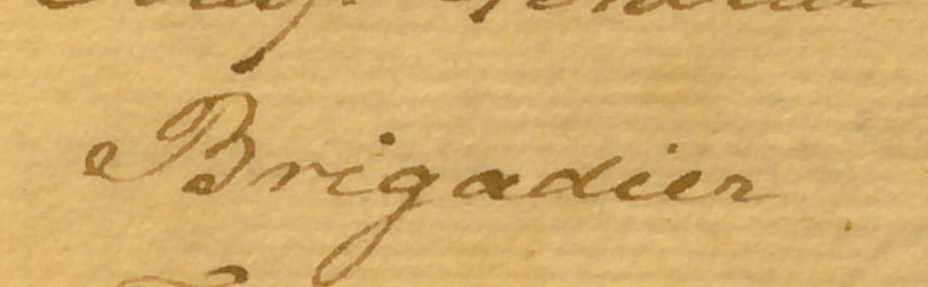Brigadier
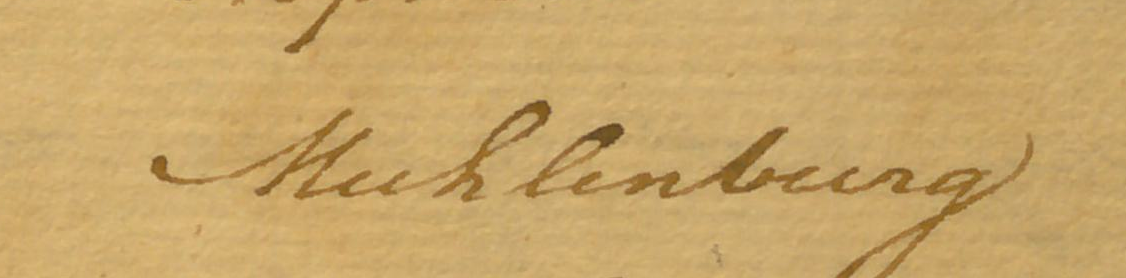Muhlenburg
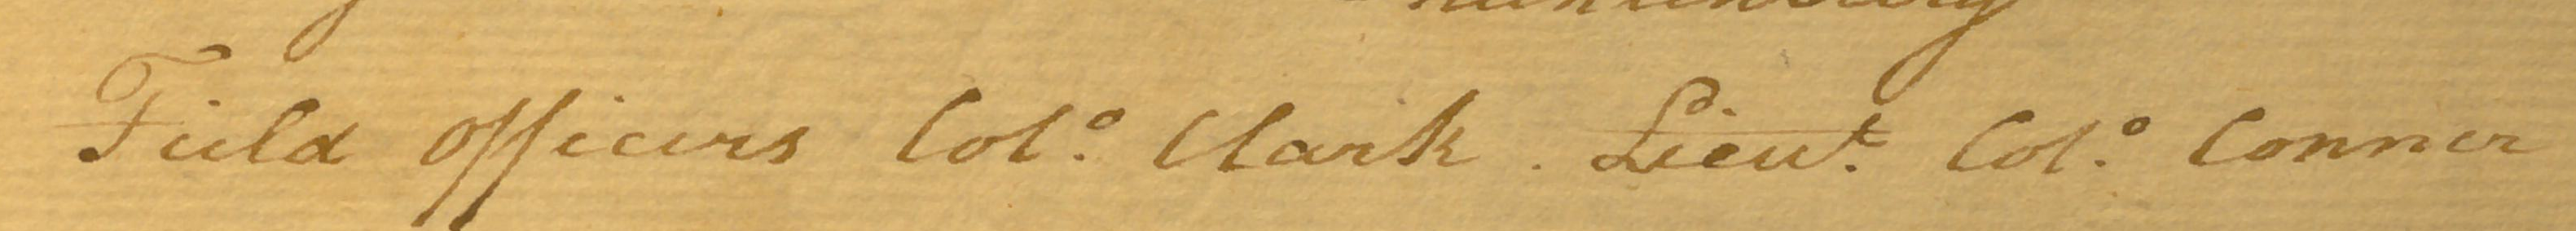Field Officers Col^o. Clark. Lieu^t. Col^o. Conner
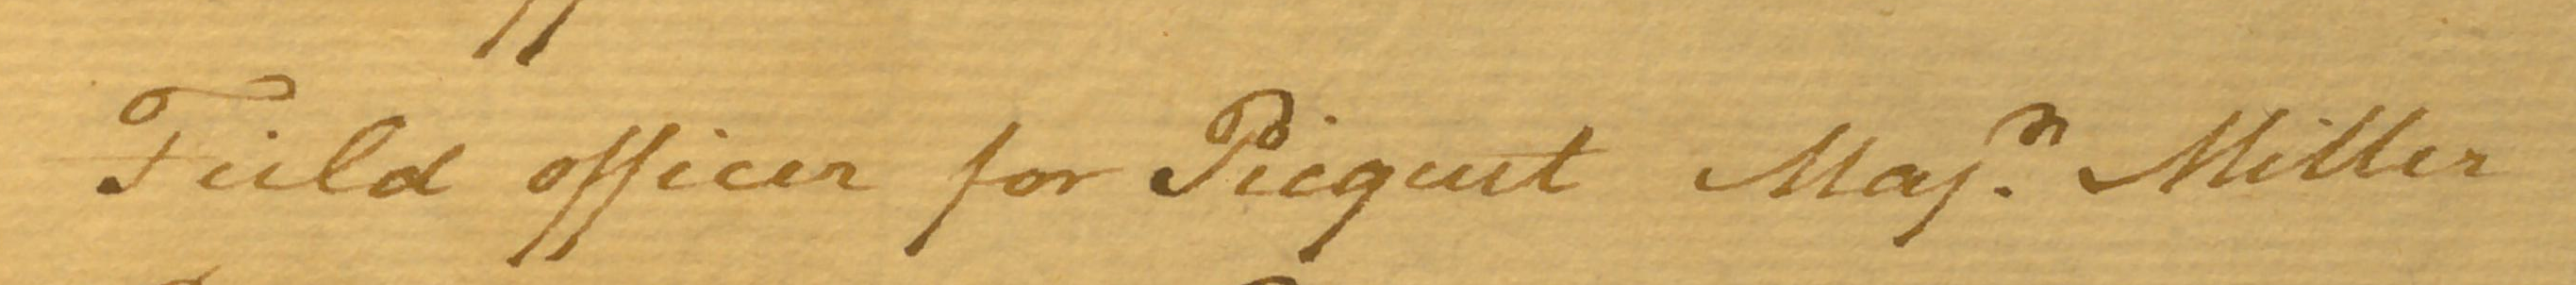Field officer for Picquet Maj^r. Miller
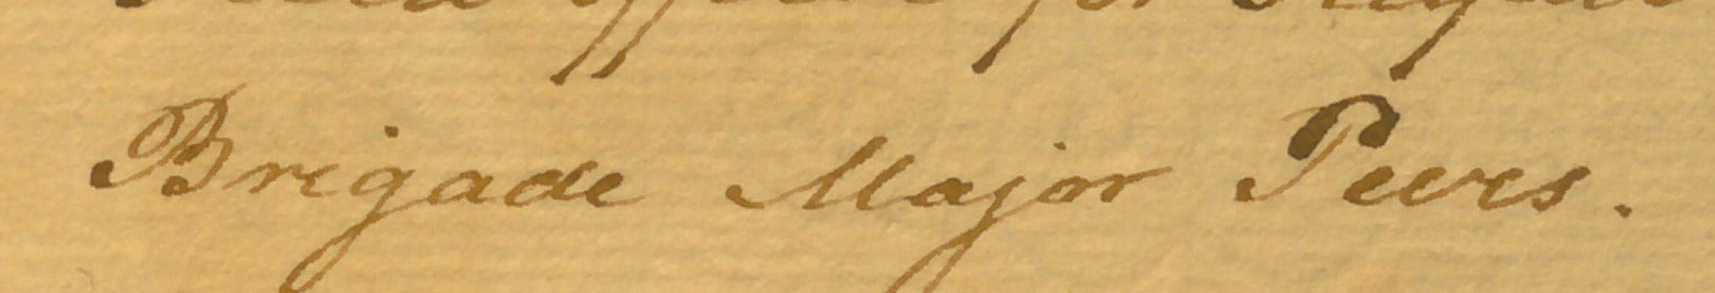Brigade Major Peers
